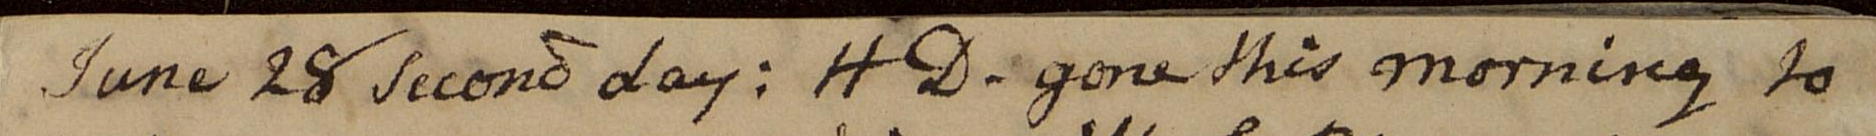June 28 second day: HD- gone this morning to
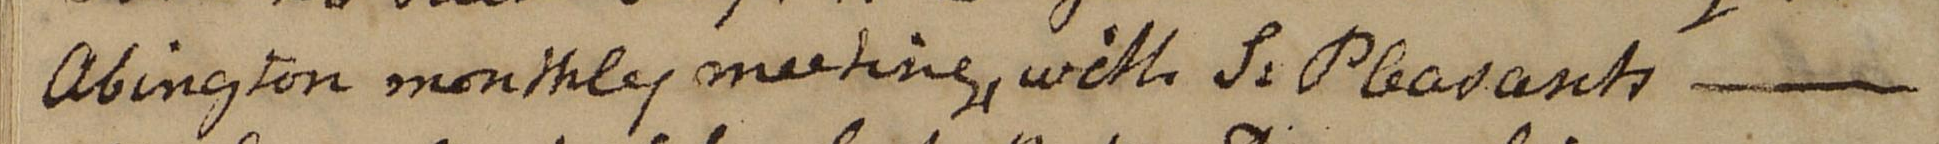Abington monthly meeting, with S: Pleasants-
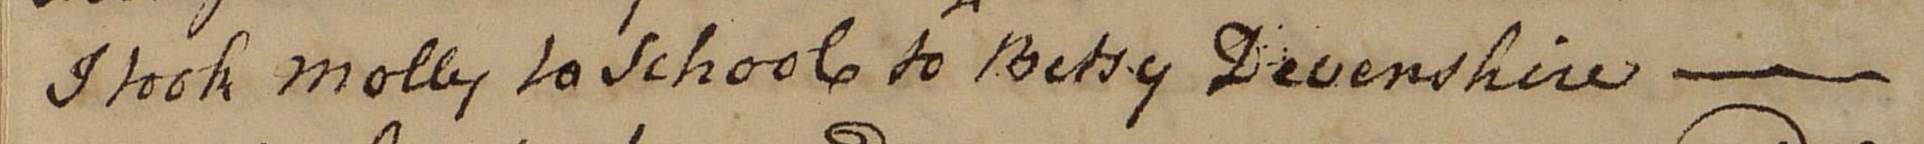I took Molly to School to Betsy Devenshire-
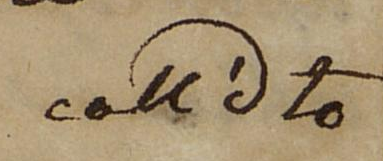call'd to
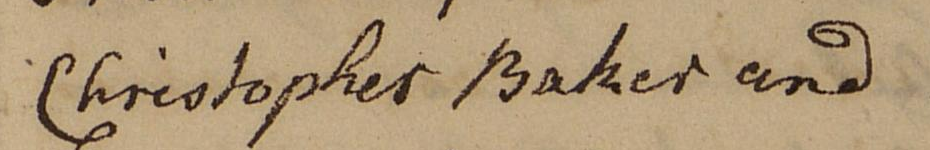Christopher Baker and
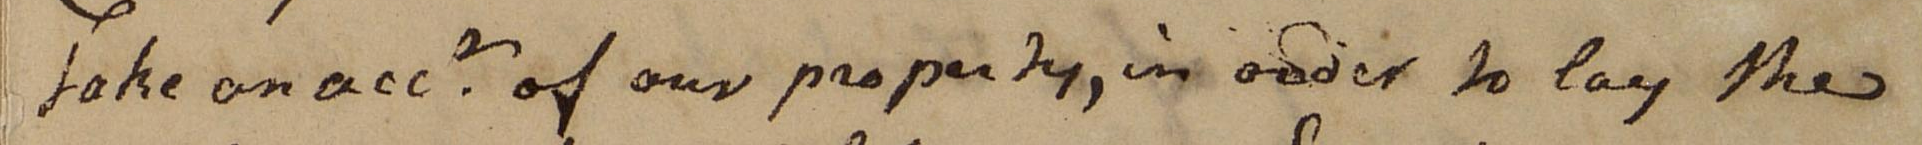take on acc^t. of our property, in order to lay the
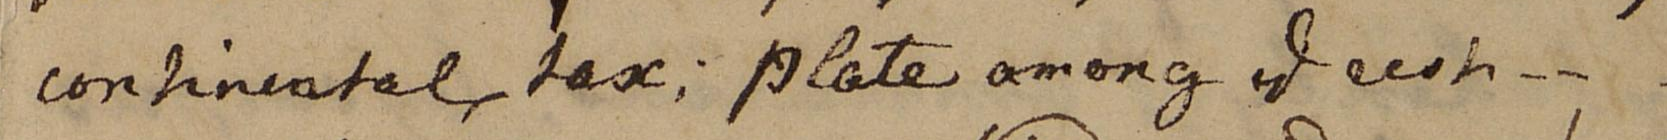continental tax; plate among y^e rest--
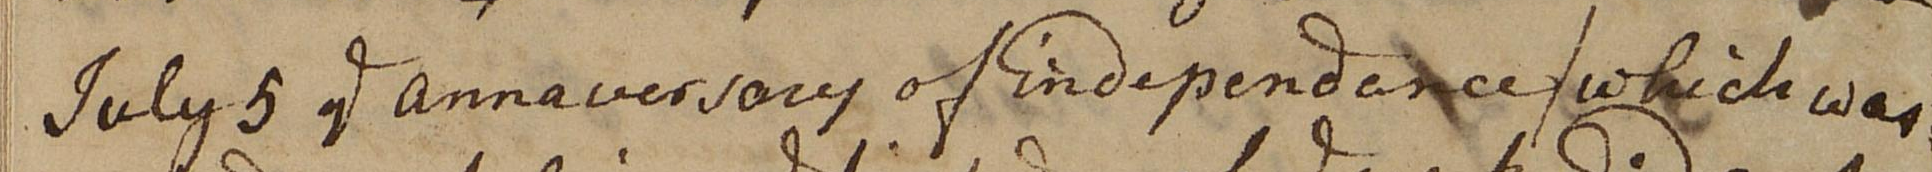July 5 y^e annaversary of independance (which was
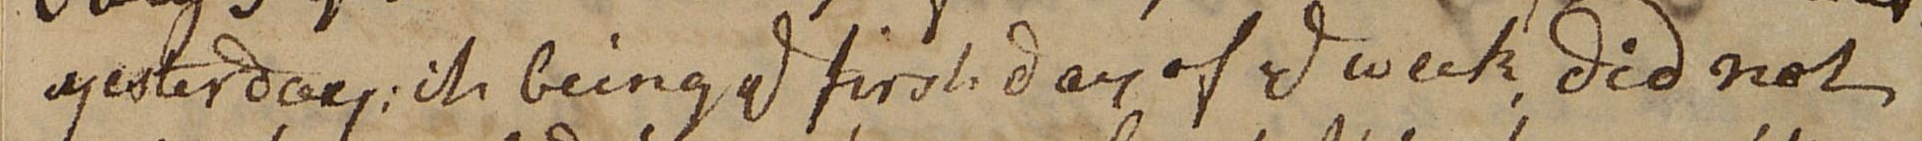yesterday: it being y^e first day of y^e week, did not
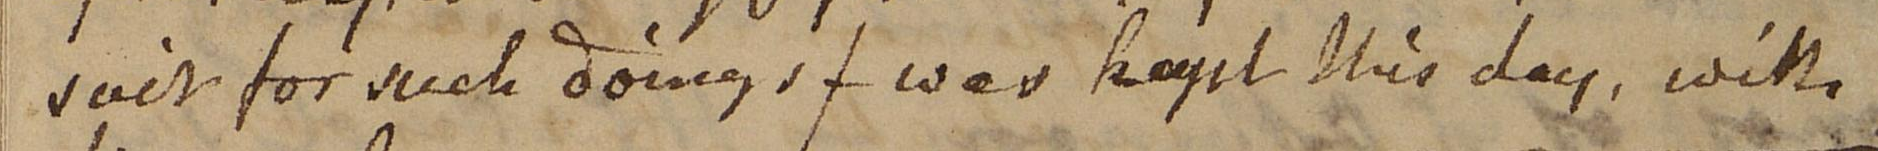suit for such doings) was kayst this day, with
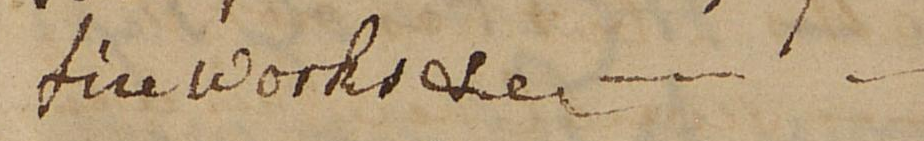fire Works &c-
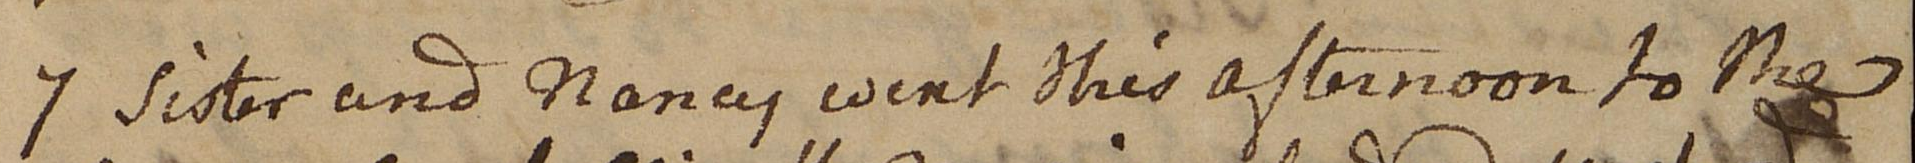7 Sister and Nancy went this a Afternoon to the
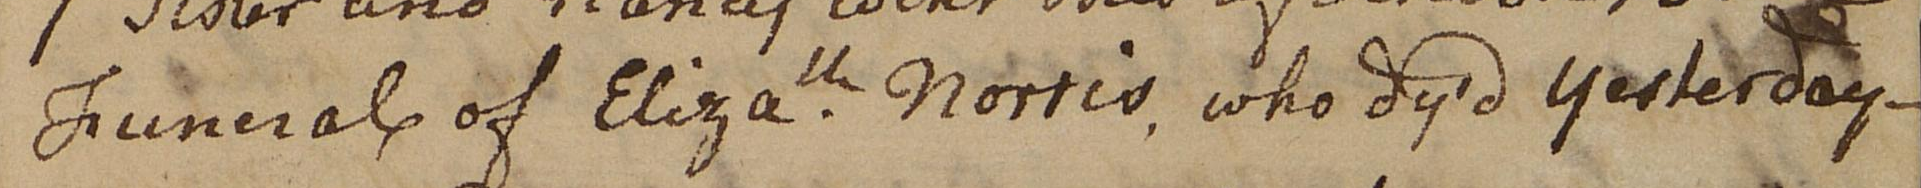Funeral of Eliza^th. Norris, who dy'd yesterday-
